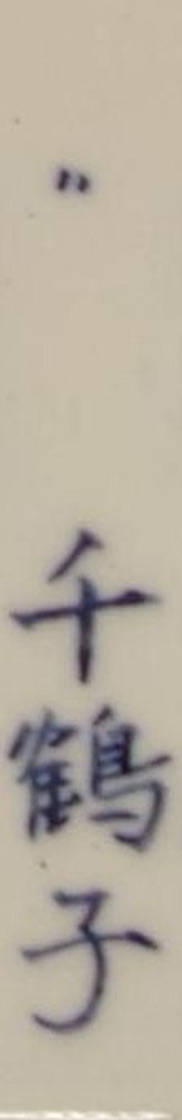千鶴子
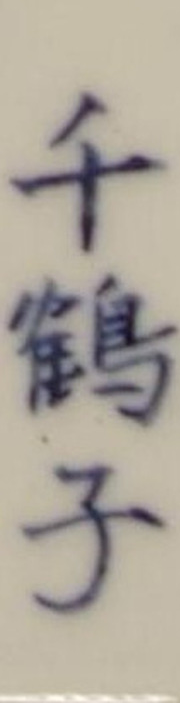千鶴子
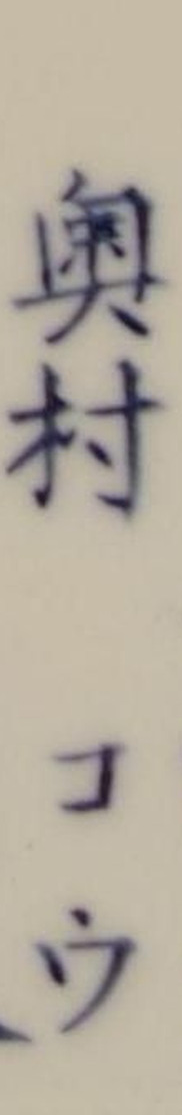奥村コウ
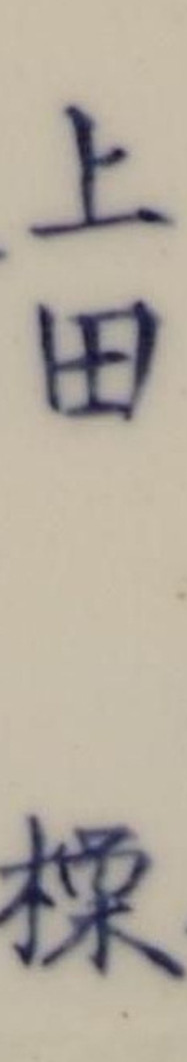上田楝
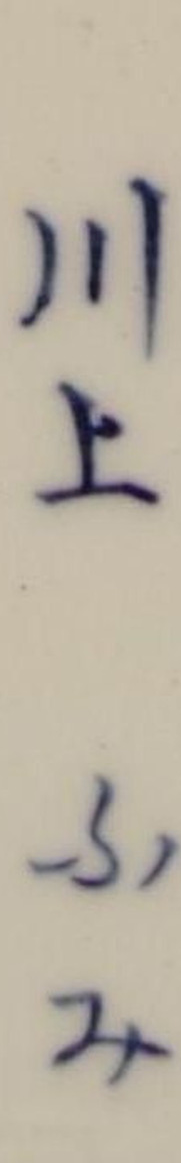川上ふみ
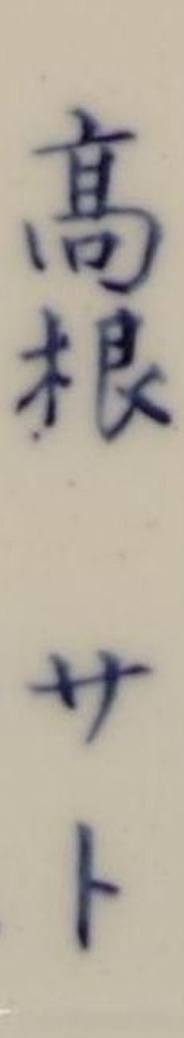高根サト
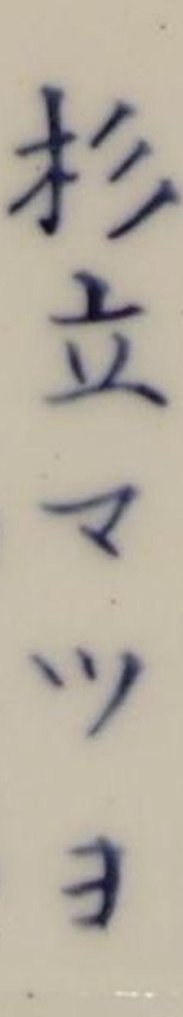杉立マツヨ
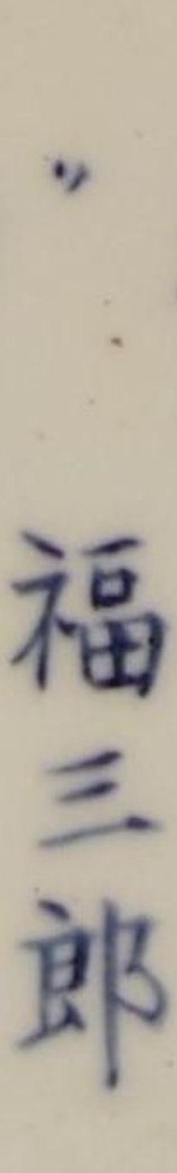福三郎
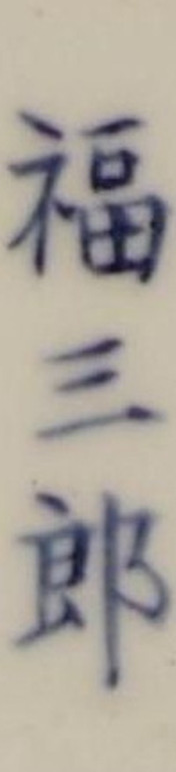福三郎
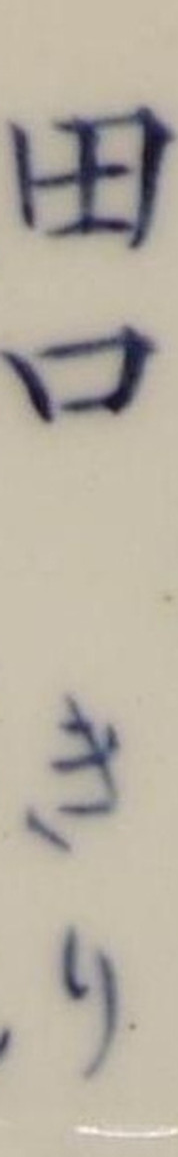田口きり
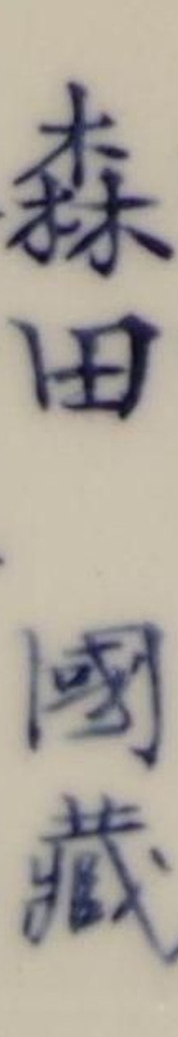森田國蔵
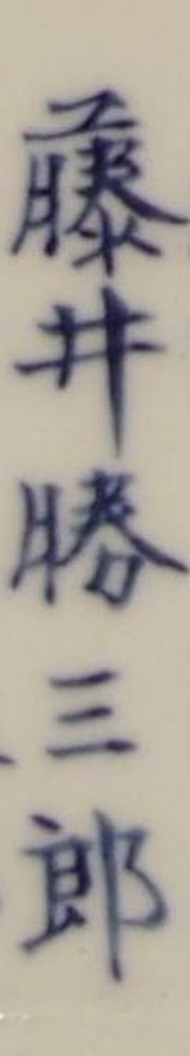藤井勝三郎
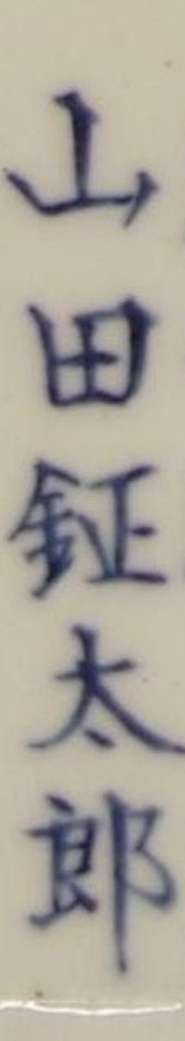山田鉦太郎
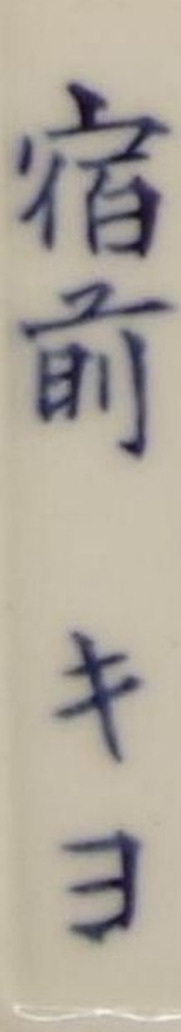宿前キヨ

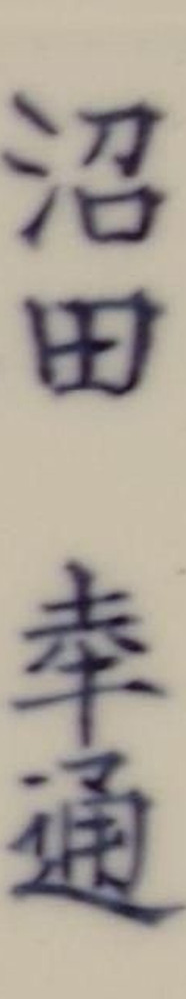沼田幸通
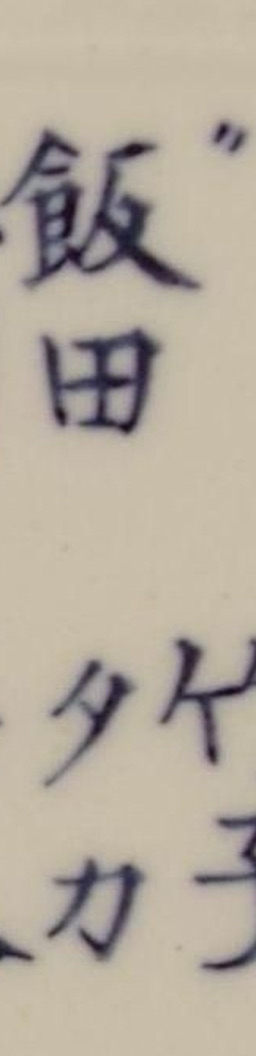飯田夕カ
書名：E~L
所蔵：高野山金剛峯寺
